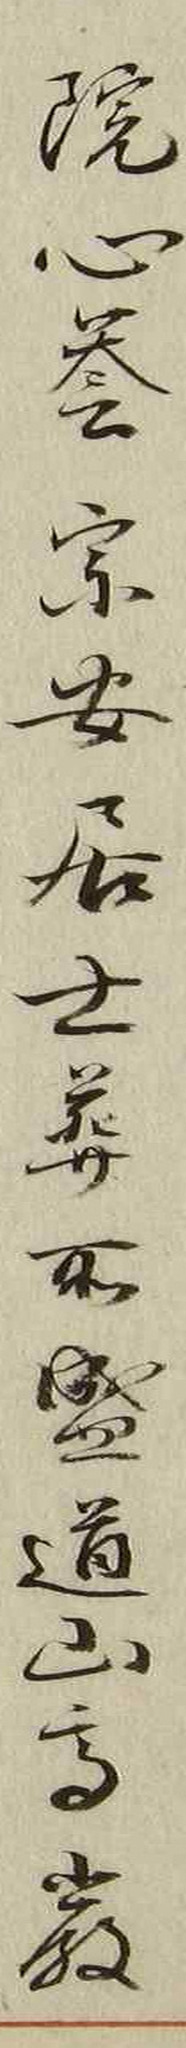院心誉宗安居士葬所盛道山高厳
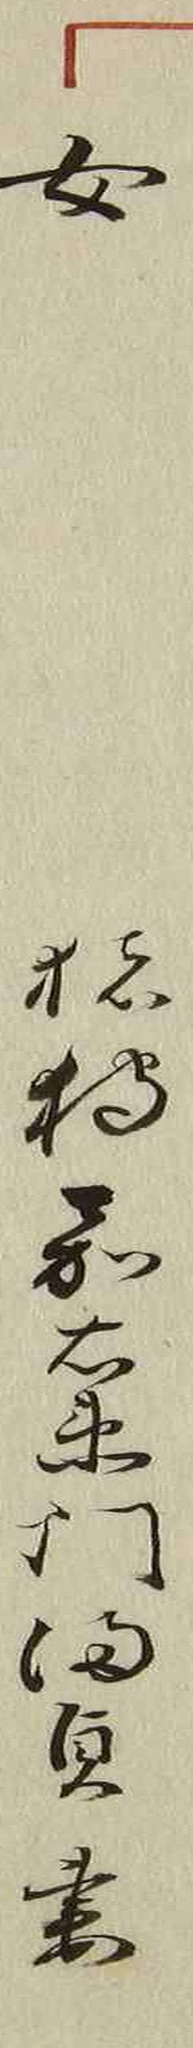女猪狩嘉右衛門満貞妻
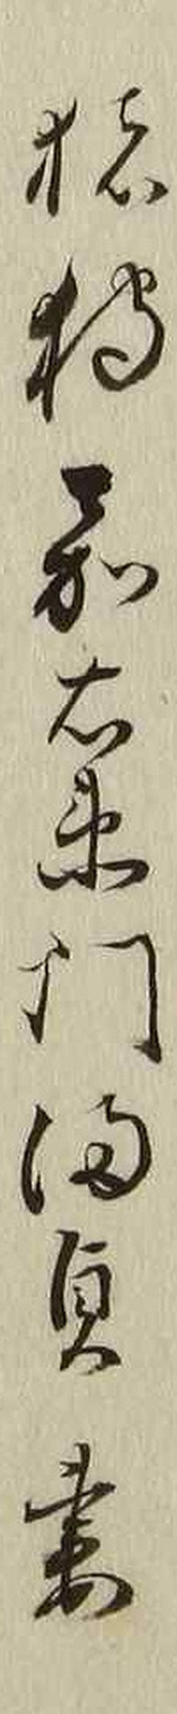女猪狩嘉右衛門満貞妻
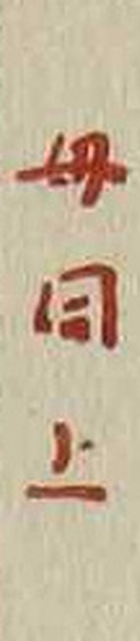母同上
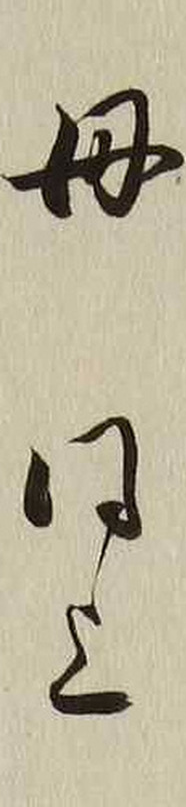母同上
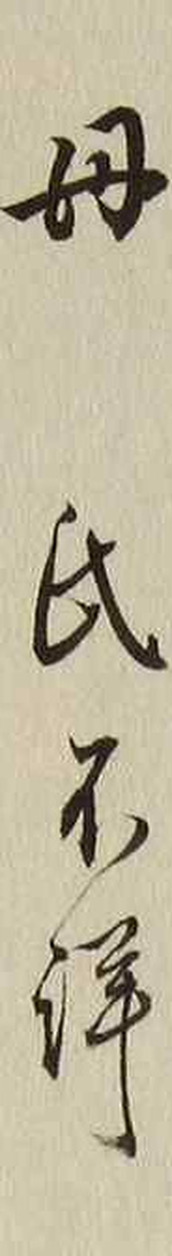母氏不詳
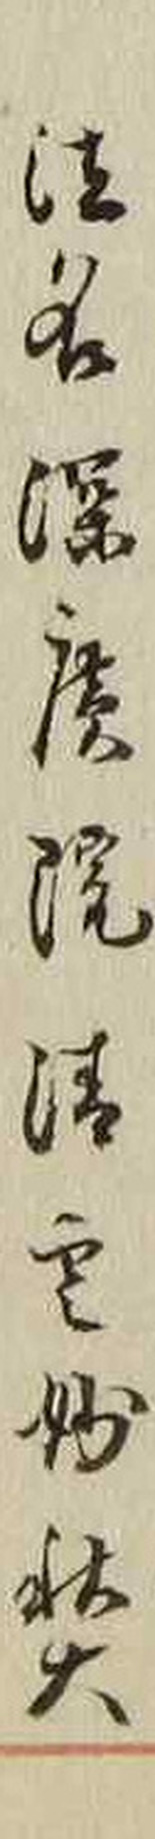法名深広院清雲妙秋大
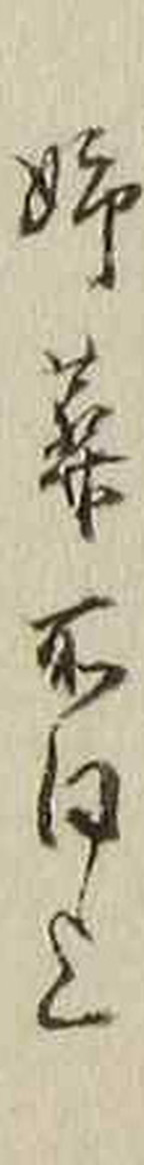姉葬所同上
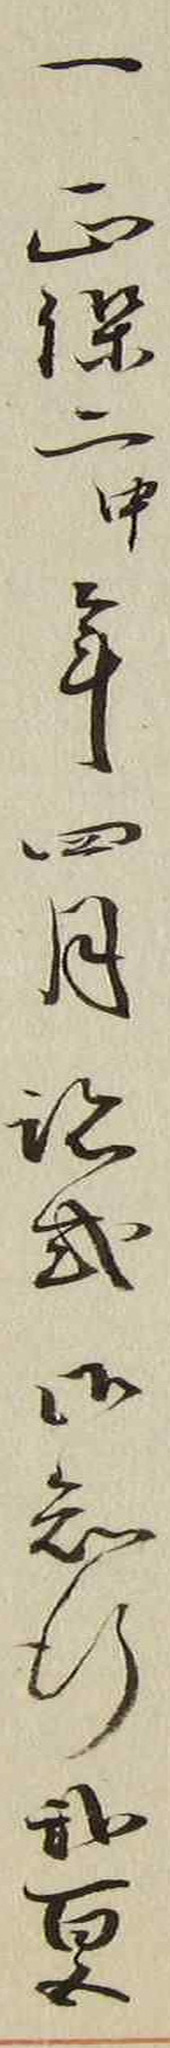一正保二申年四月跡式御知行弐百五
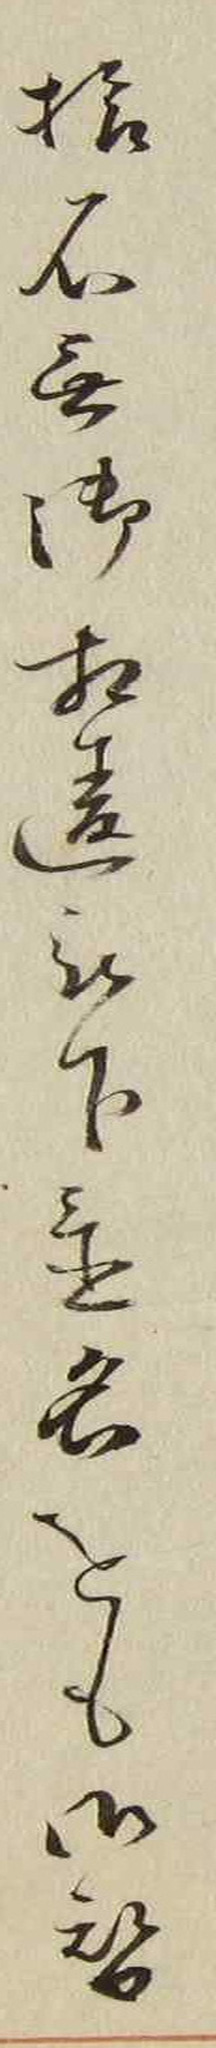拾石無御相違被下置名をも御替

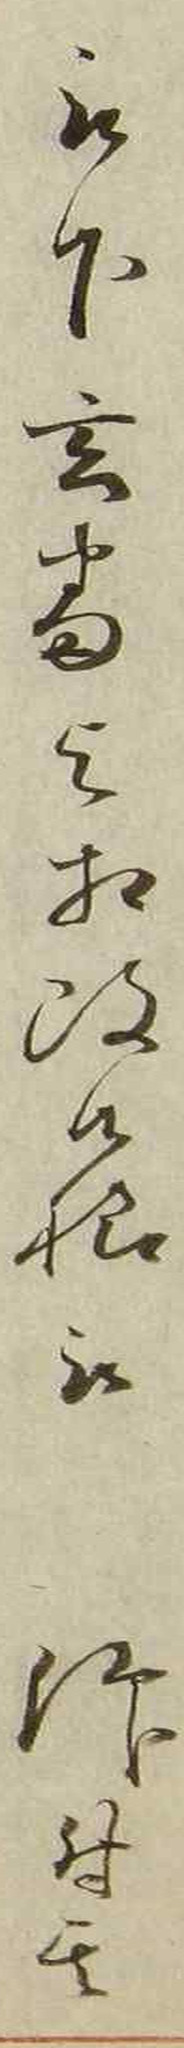被下玄番与相改候様被仰付其
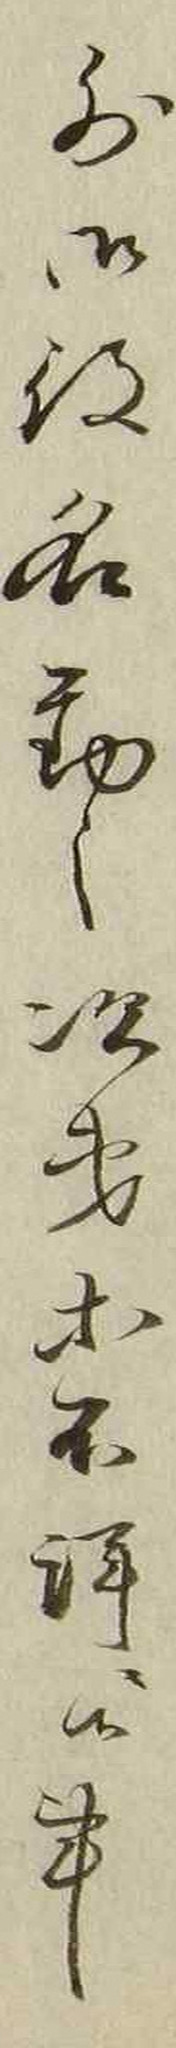外御役名勤之次第等不詳ニ候事
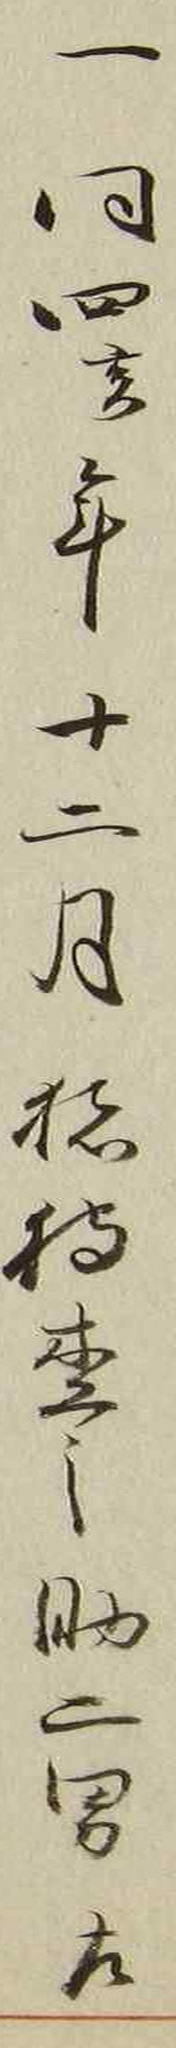一同四亥年十二月猪狩杢之助二男左
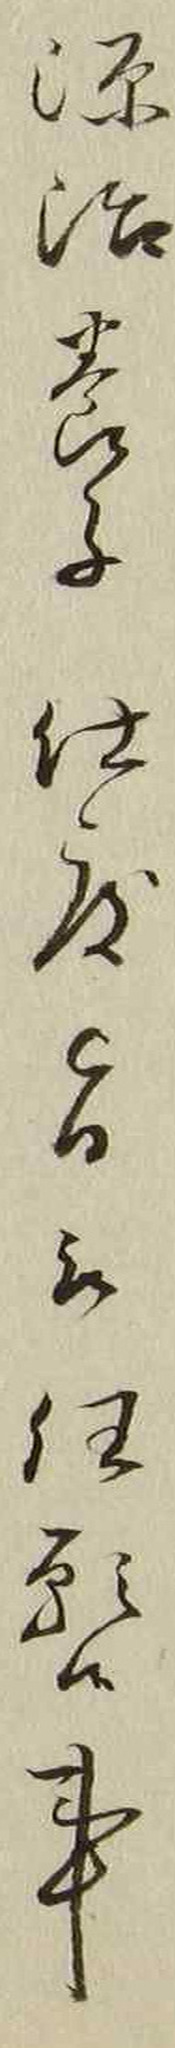源治養子仕度旨被任願候事
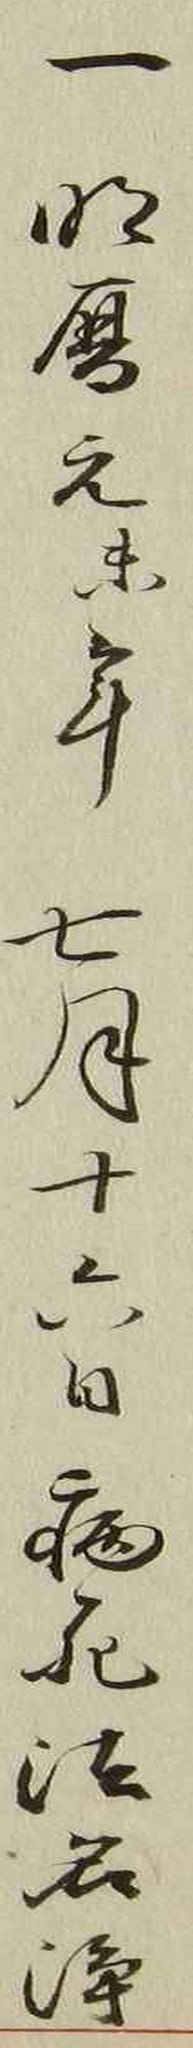一明暦元未年七月十六日病死法名浄
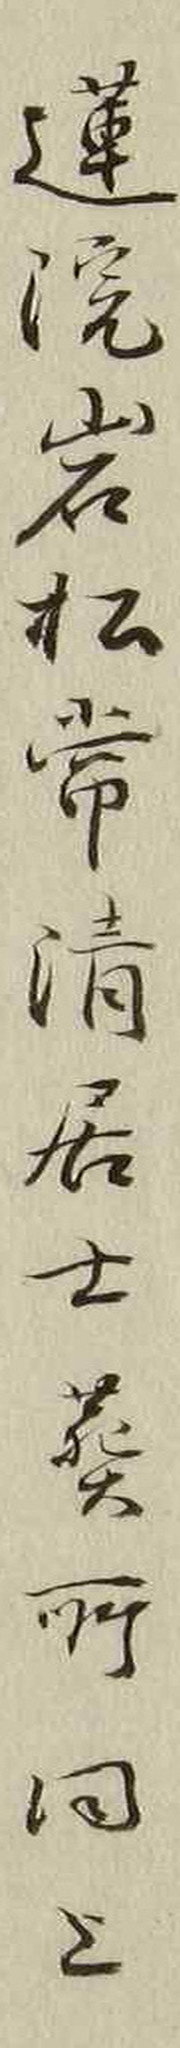蓮院岩松常清居士葬所同上
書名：諸士系譜　巻之28　い之部28
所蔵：会津若松市立会津図書館
